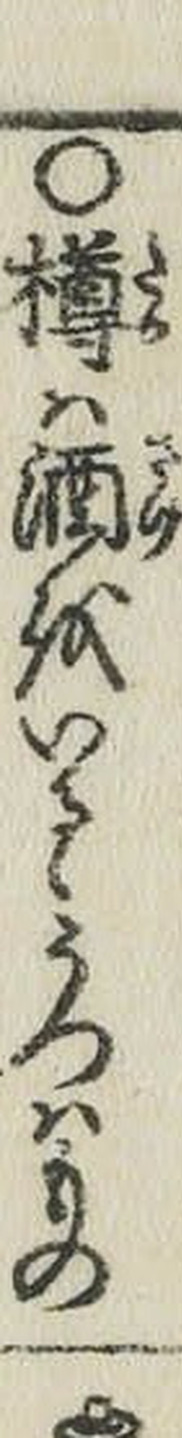○樽は酒をいるゝうつはもの
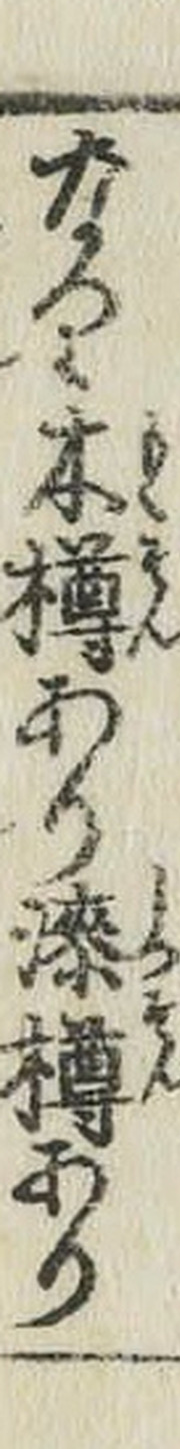なり木樽あり漆樽あり
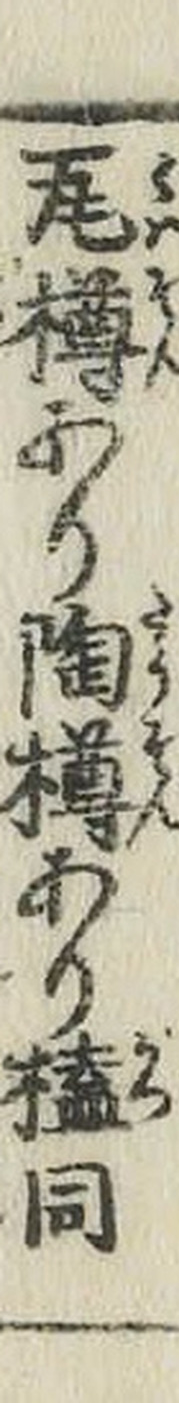瓦樽あり陶樽あり榼同
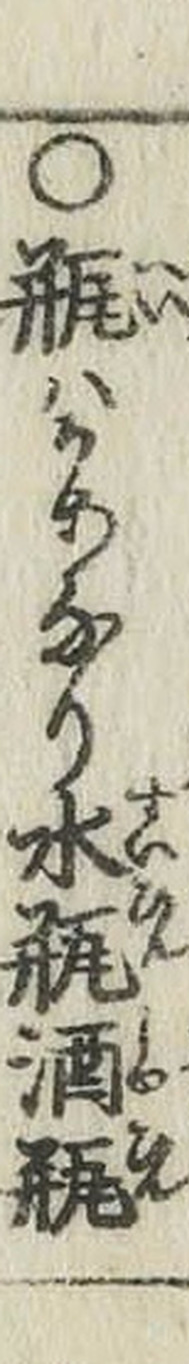○瓶はかめなり水瓶酒瓶
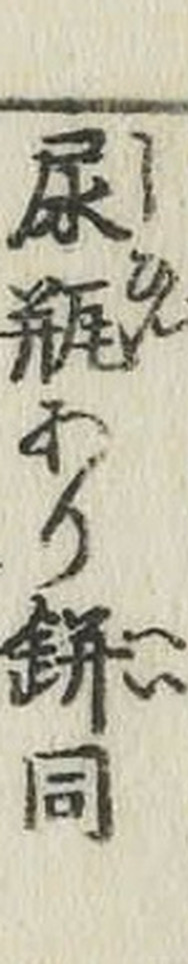尿瓶あり鉼同
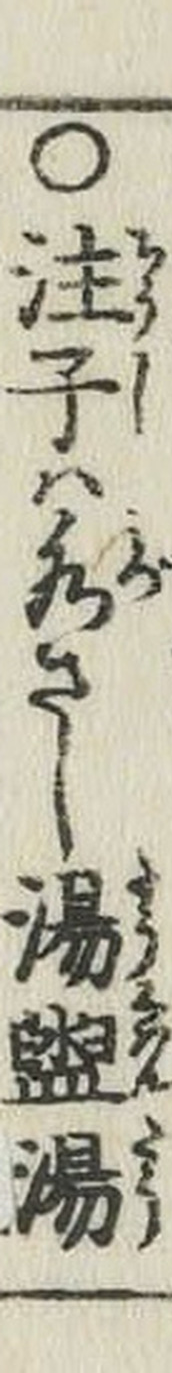○注子は水さし湯盥湯
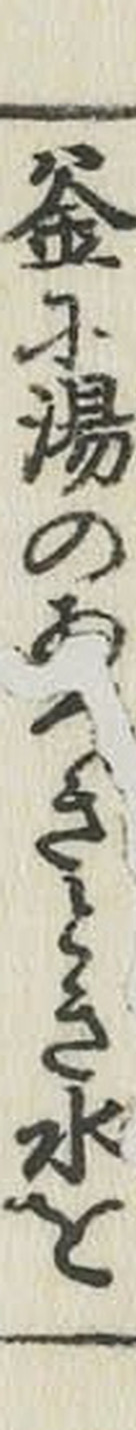釜に湯のあつきとき水を
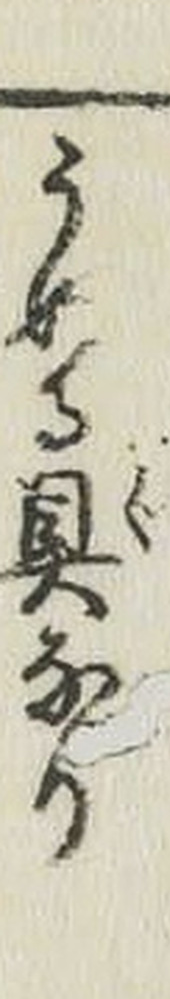うめる具なり
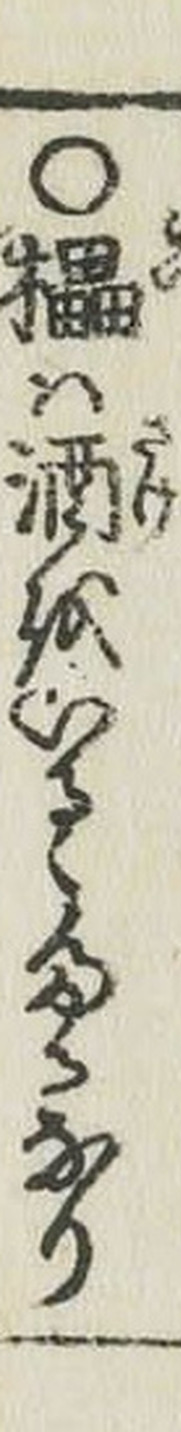○櫑は酒をいるゝたるなり
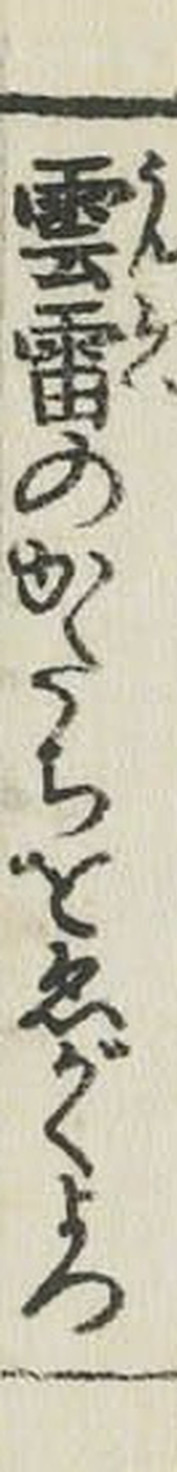雲雷のかたちをゑがくよつ
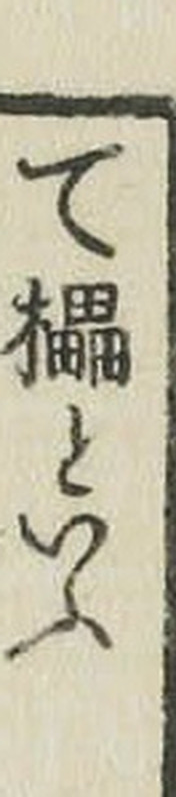て櫑といふ
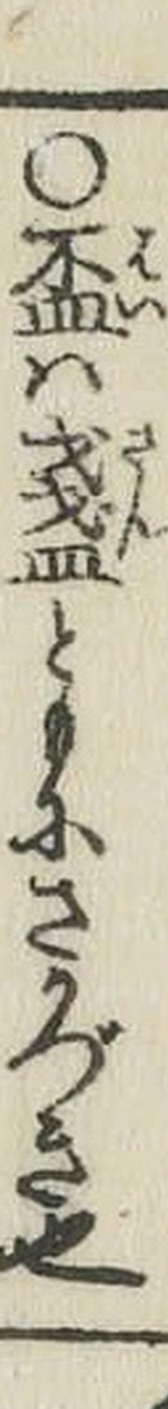○盃は盞ともにさかづき也
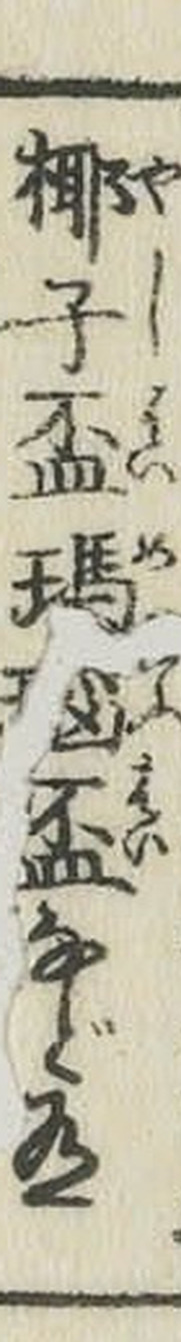椰子盃瑪瑙盃など有
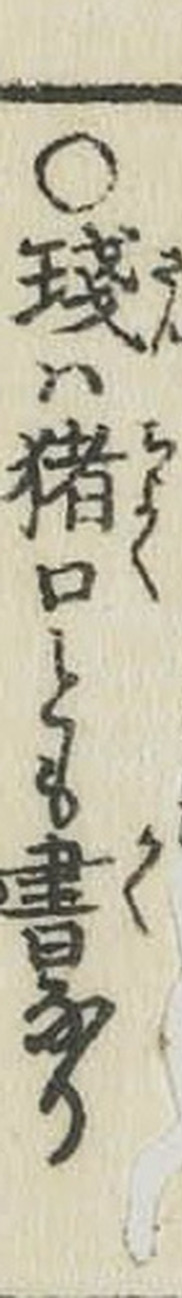○琖は猪口とも書なり
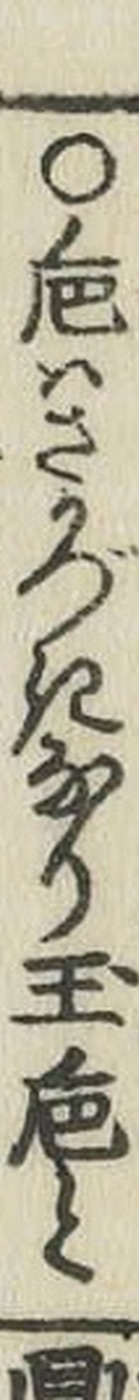○巵はさかづきなり玉巵と
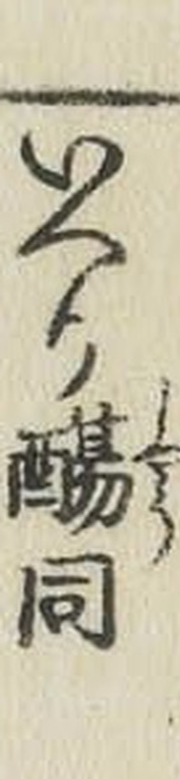いへり𨢩同
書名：増補頭書訓蒙図彙大成 10巻 5:巻之9-11
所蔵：東京学芸大学教育コンテンツアーカイブ
